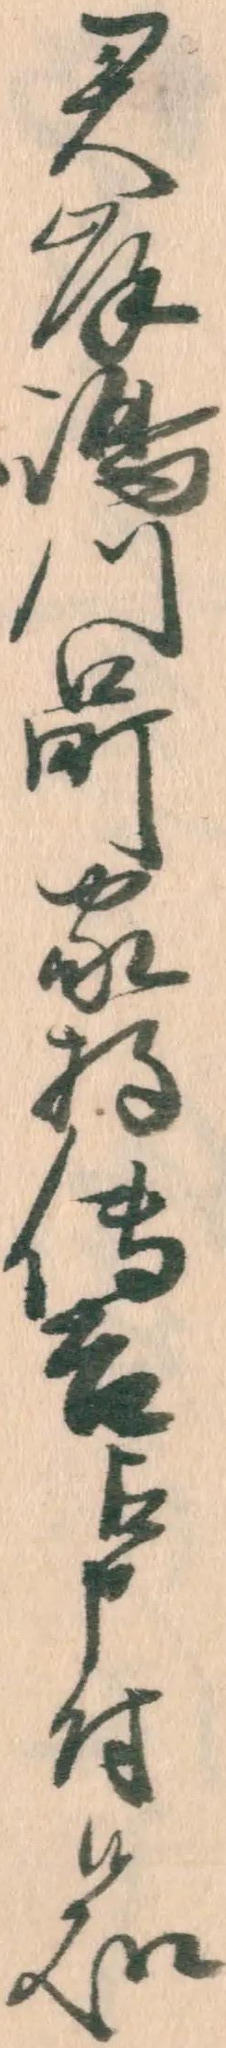霊岸嶋川口町家持伝吉え申付候処
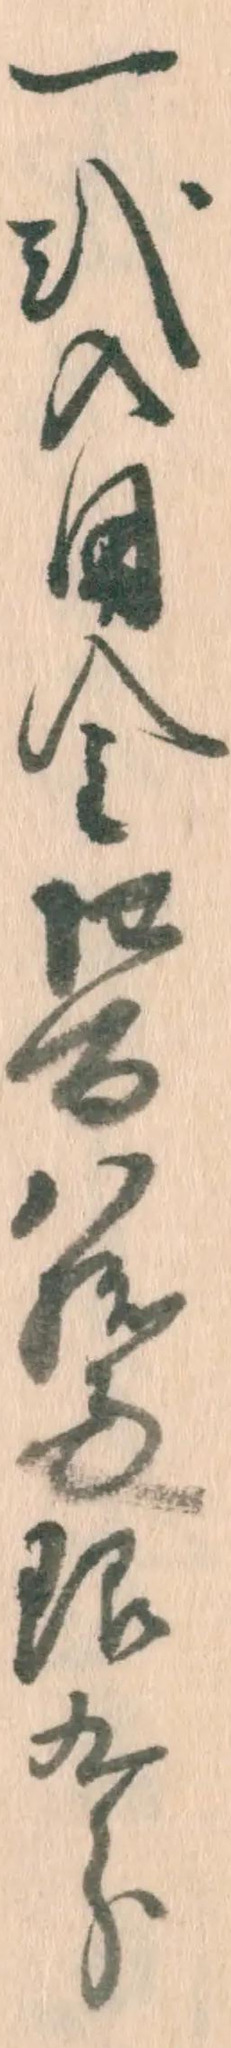一式入用金四百八拾両銀九分
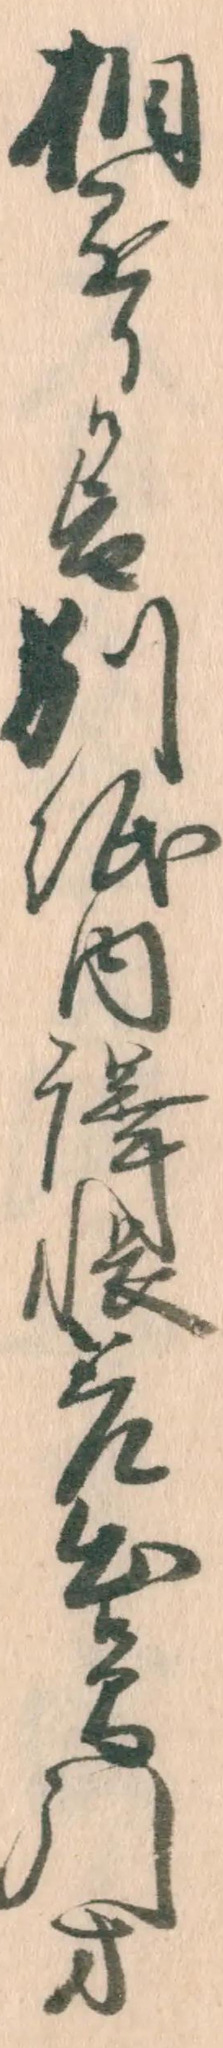相懸り候旨別紙内訳帳差出候間引方
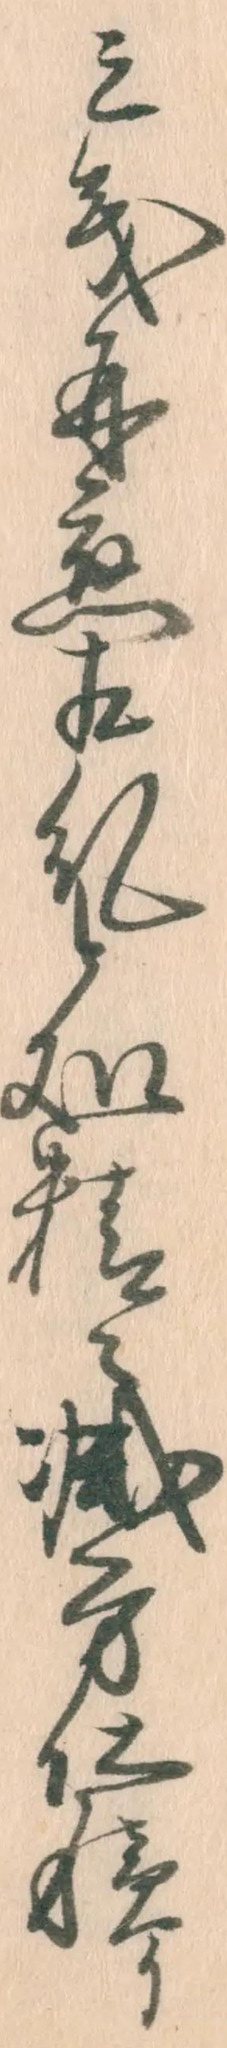之義再応相糺候処精々減方仕積り

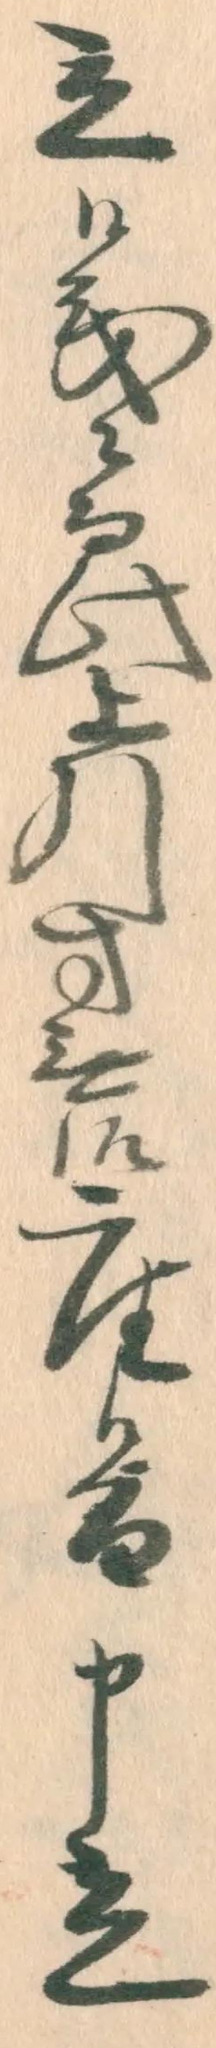立候義に而此上引方無御座候旨申立
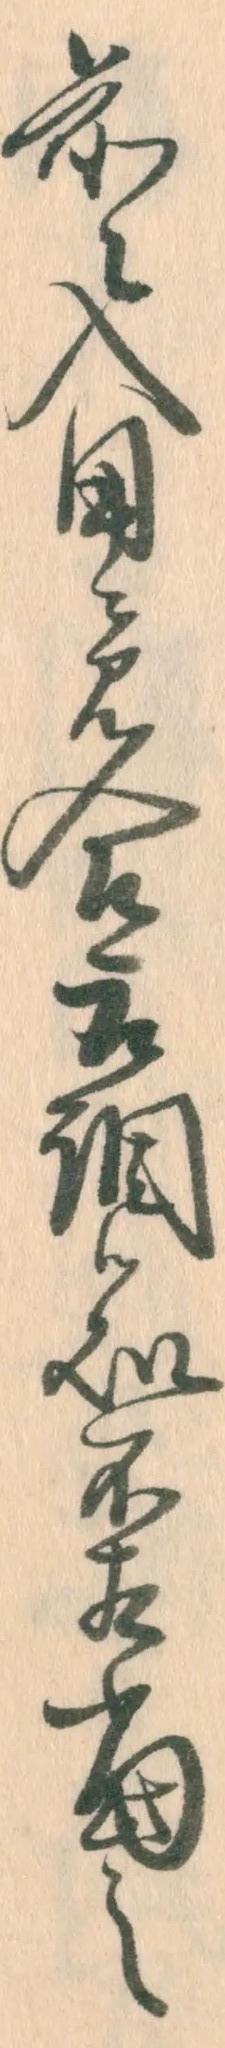前々入用に見合取調候処不相当之
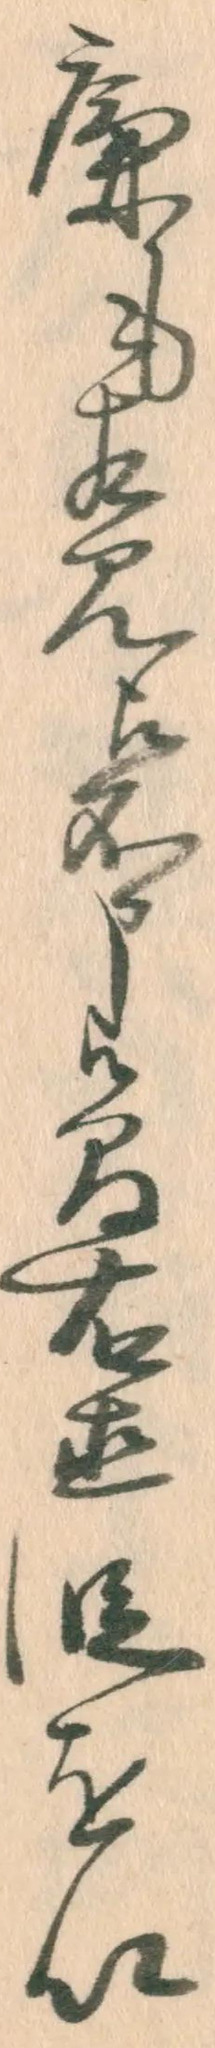廉も相見え不申候間右直段を以
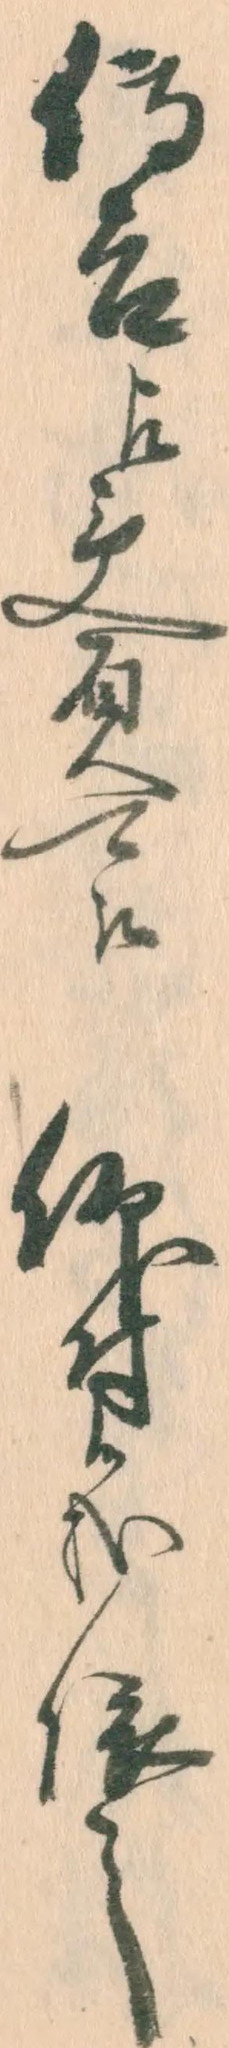伝吉え受負可被仰付候哉依之
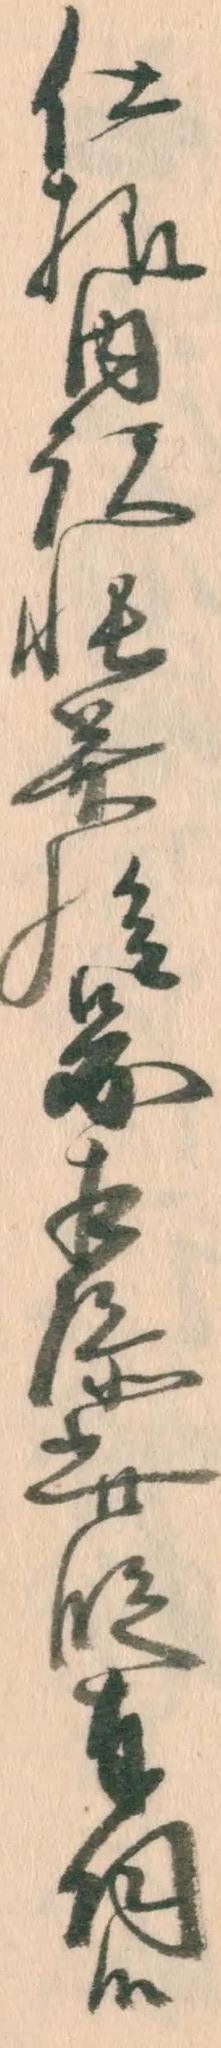仕様内訳帳并絵図相添此段奉伺候
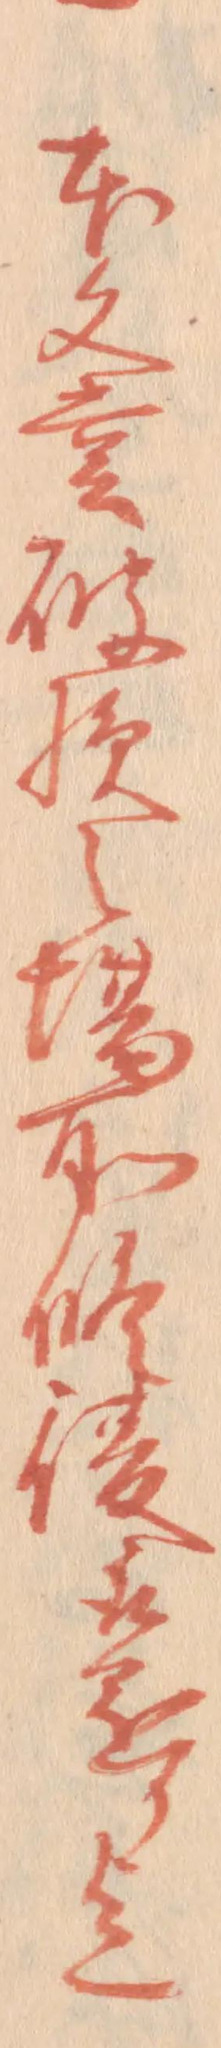一本文堂破損之場所修復取懸り迄
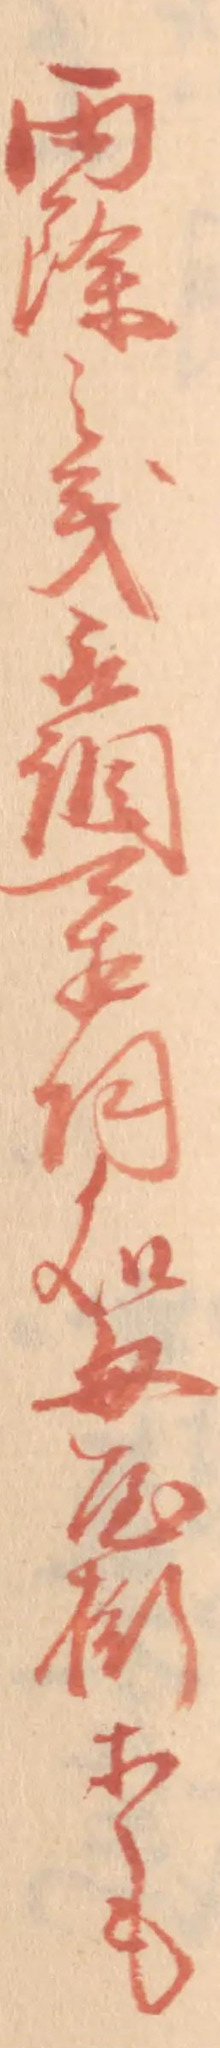雨除之義取調可相伺処母屋桁等も
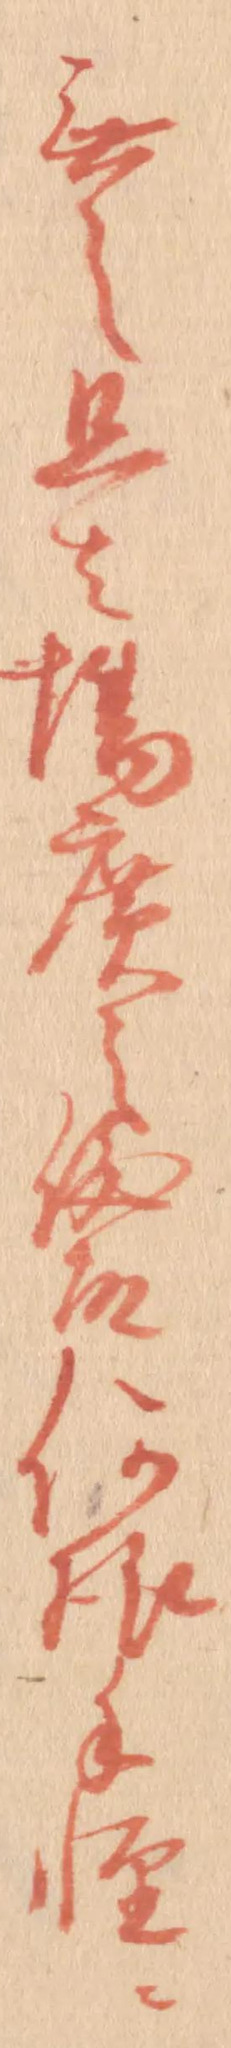無之且は場広之儀故何様手軽に
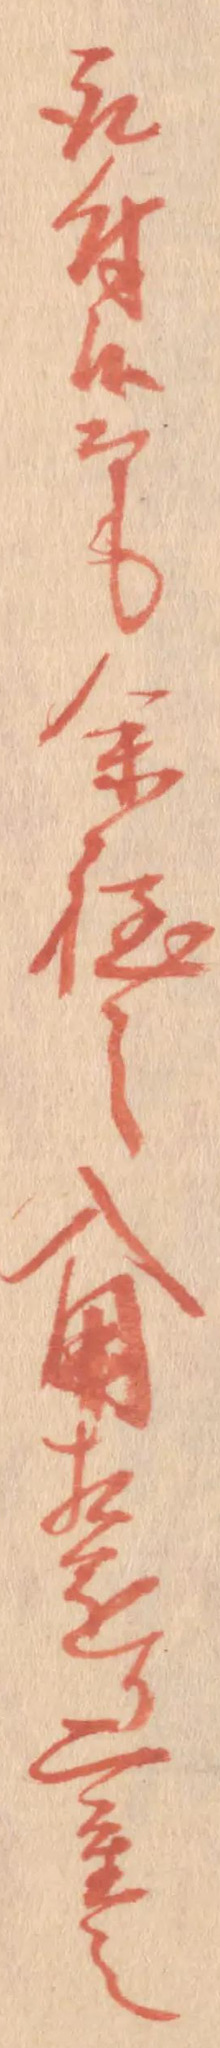取付候而も余程之入用相懸り二重之
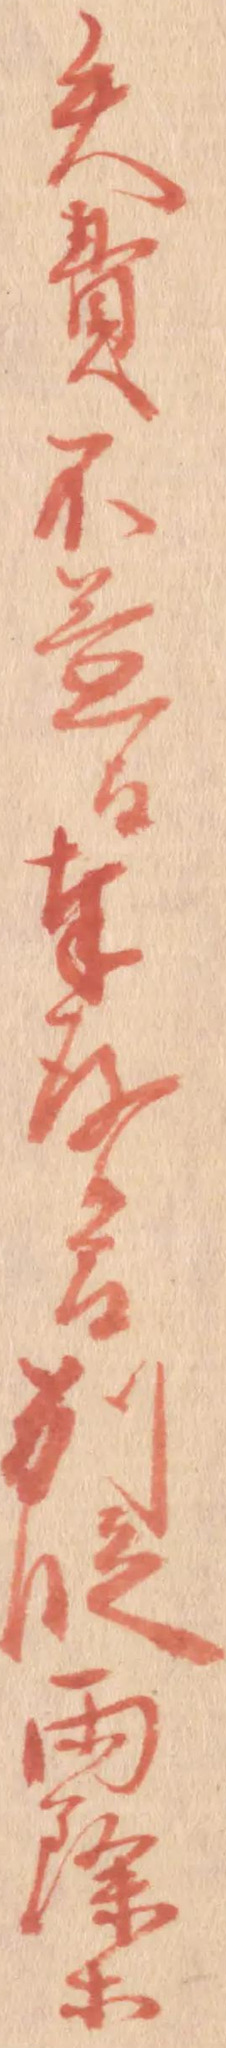失費不益と奉存候間別段雨除等
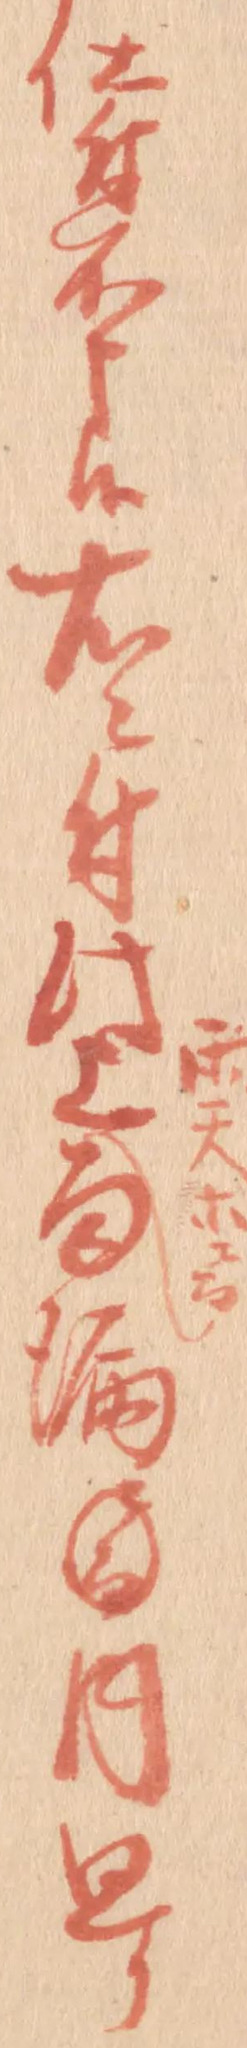仕付不申候右に付此上雨漏内廻り
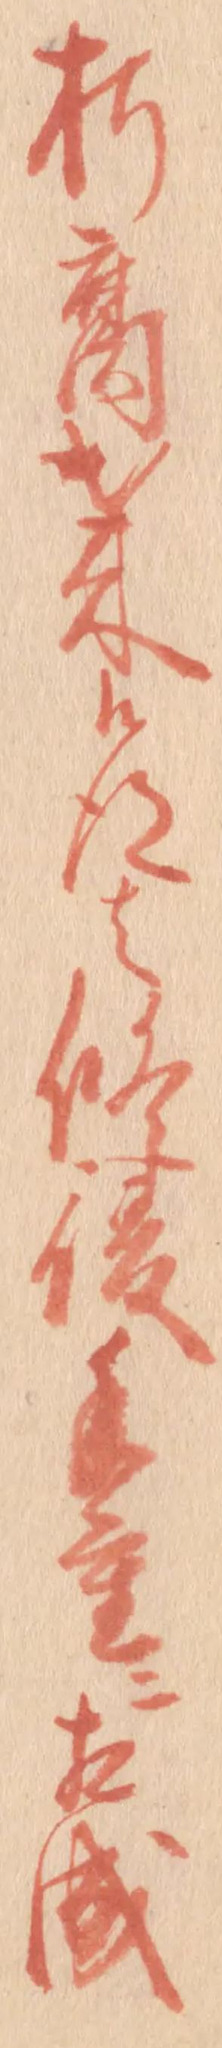朽腐出来候得は修復手重に相成
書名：三十三間堂. [1]
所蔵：国立国会図書館 National Diet Library, JAPAN
